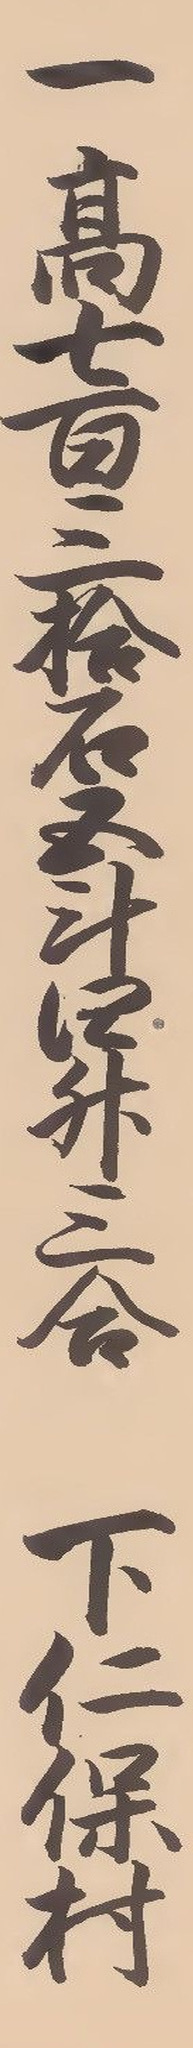一髙七百三拾石五斗四升三合下仁保村
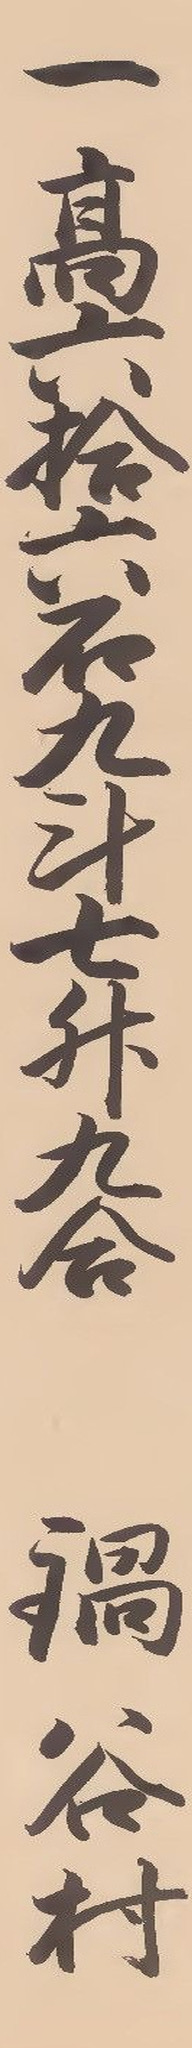一髙六拾六石九斗七升九合鍋谷村
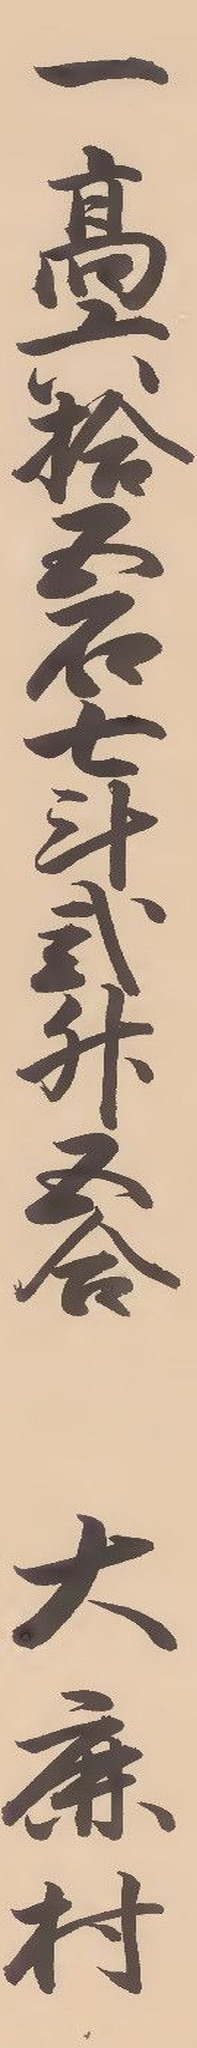一髙六拾五石七斗弐升五合大鹿村
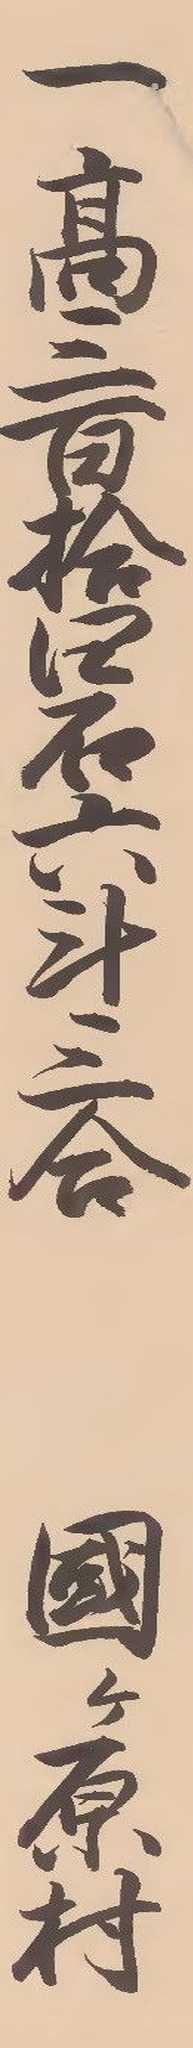一髙三百拾四石六斗三合國ケ原村
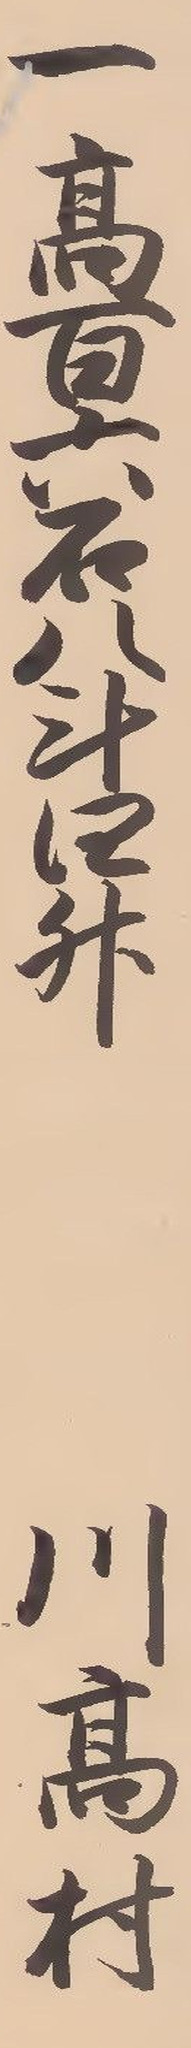一髙百六石八斗四升川髙村
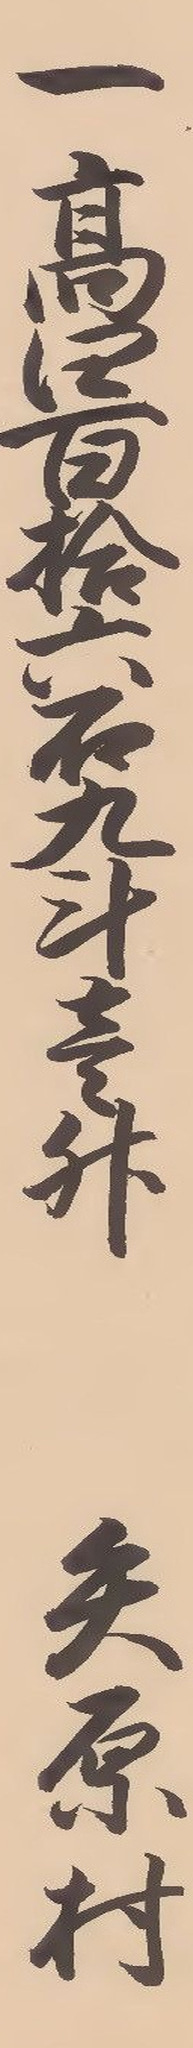一髙四百拾六石九斗壱升矢原村
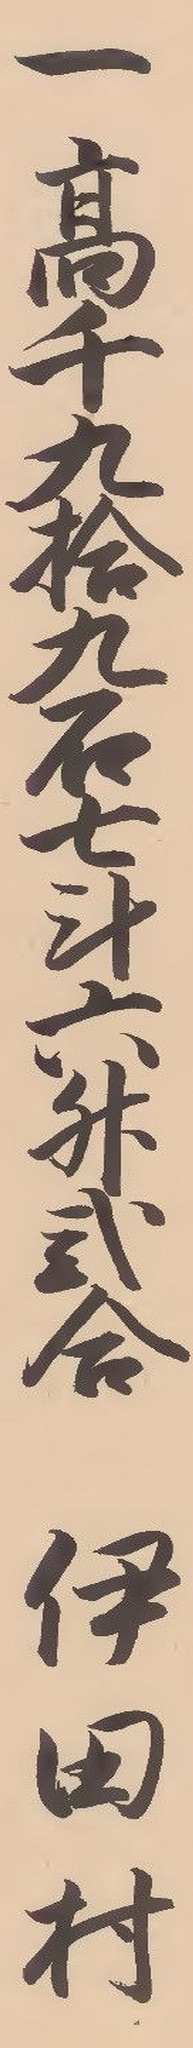一髙千九拾九石七斗六升弐合伊田村
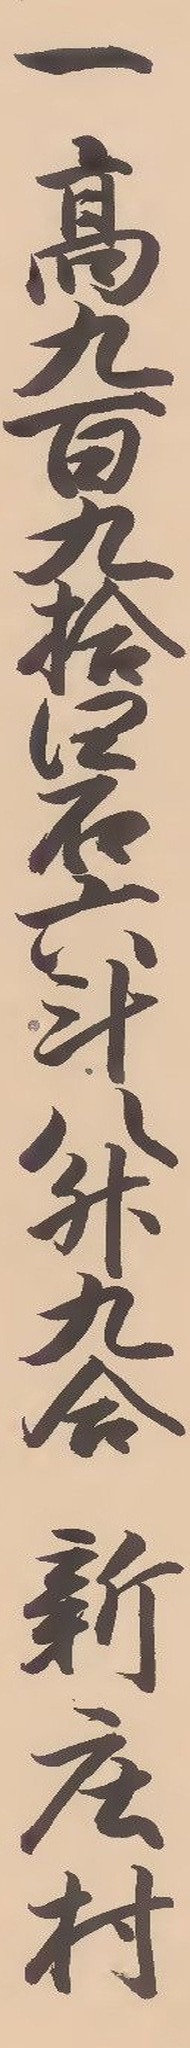一髙九百九拾四石六斗八升九合新庄村

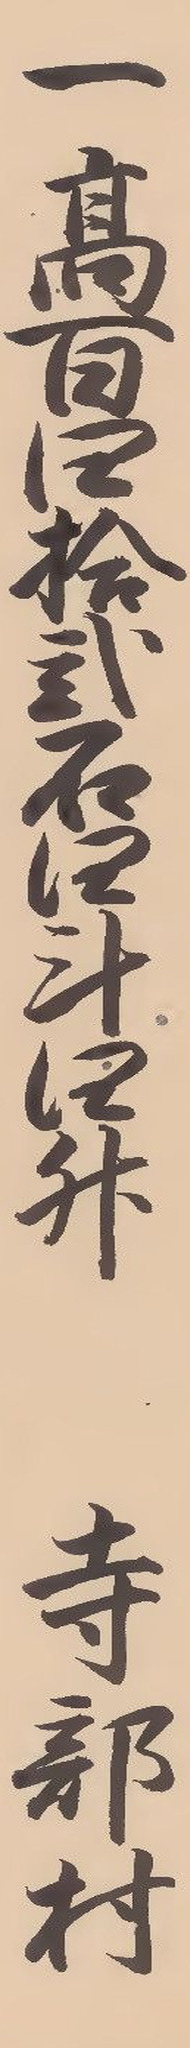一髙百四拾弐石四斗四升寺部村
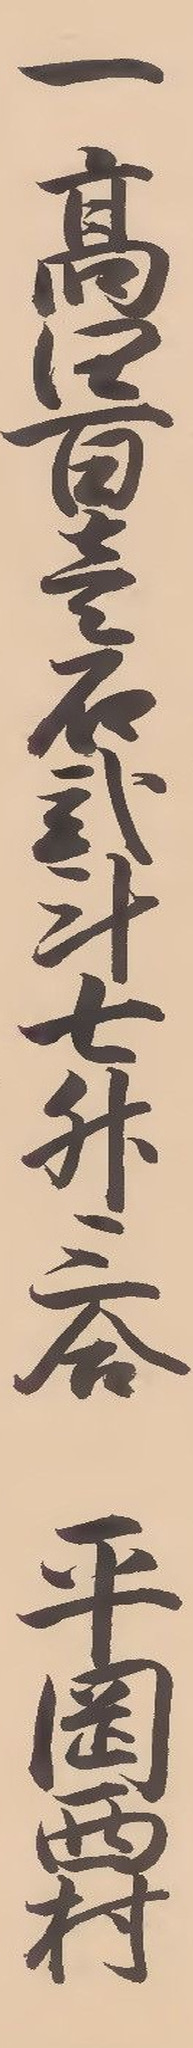一髙四百壱石弐斗七升三合平岡西村
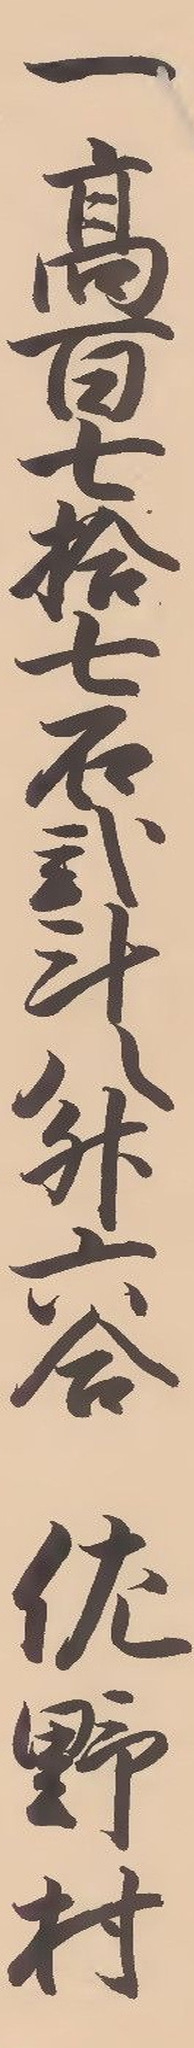一髙百七拾七石弐斗八升六合佐野村
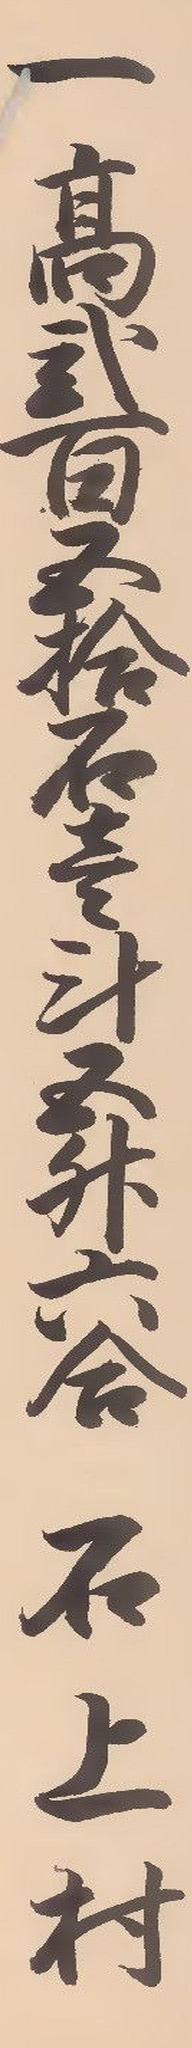一髙弐百五拾石壱斗五升六合石上村
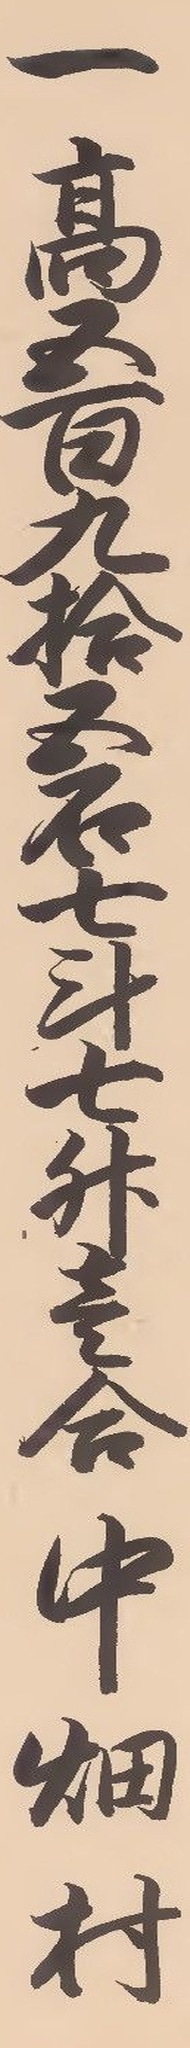一髙五百九拾五石七斗七升壱合中畑村
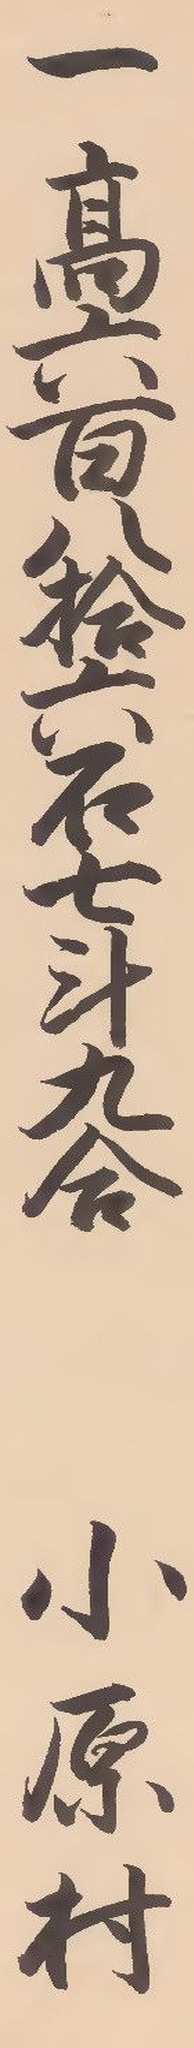一髙六百八拾六石七斗九合小原村
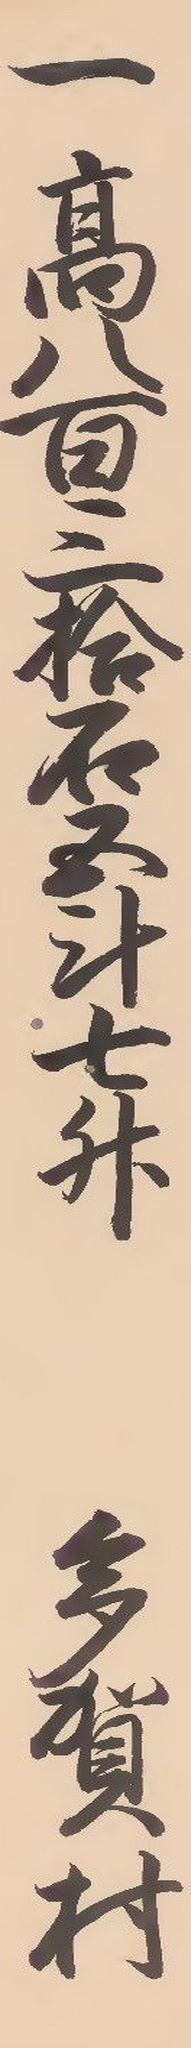一髙八百三拾石五斗七升多賀村

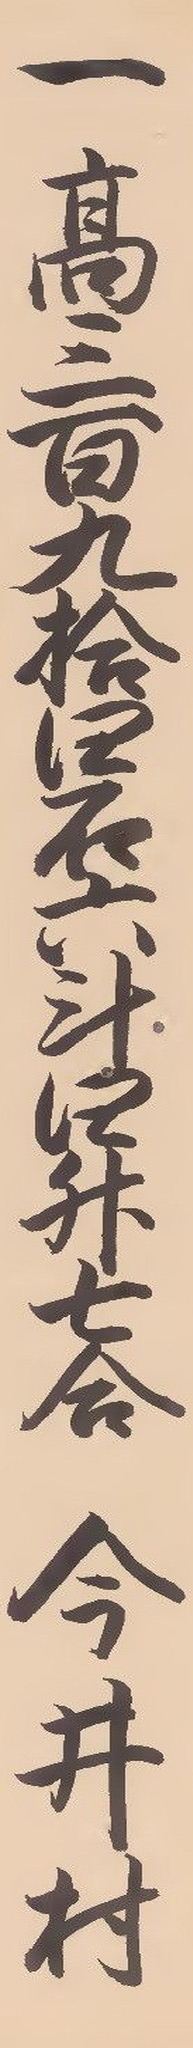一髙三百九拾四石六斗四升七合今井村
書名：備前国郷帳
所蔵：国立公文書館 National Archives of Japan
